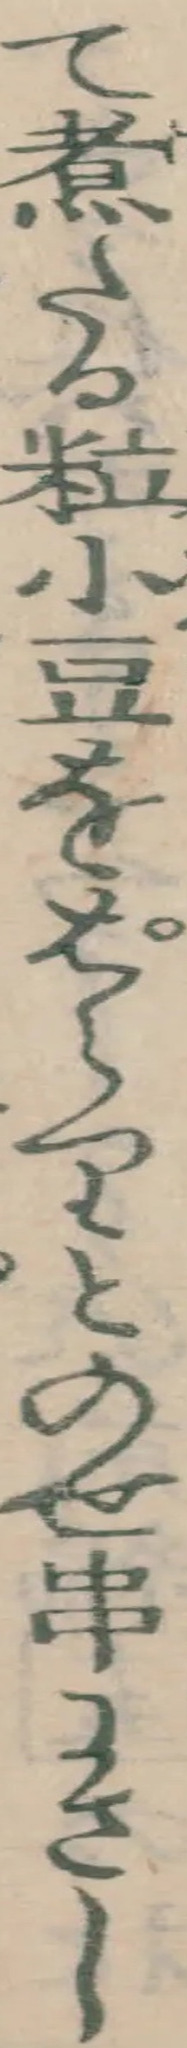て煮たる粒小豆をぱらりとのせ串にさし
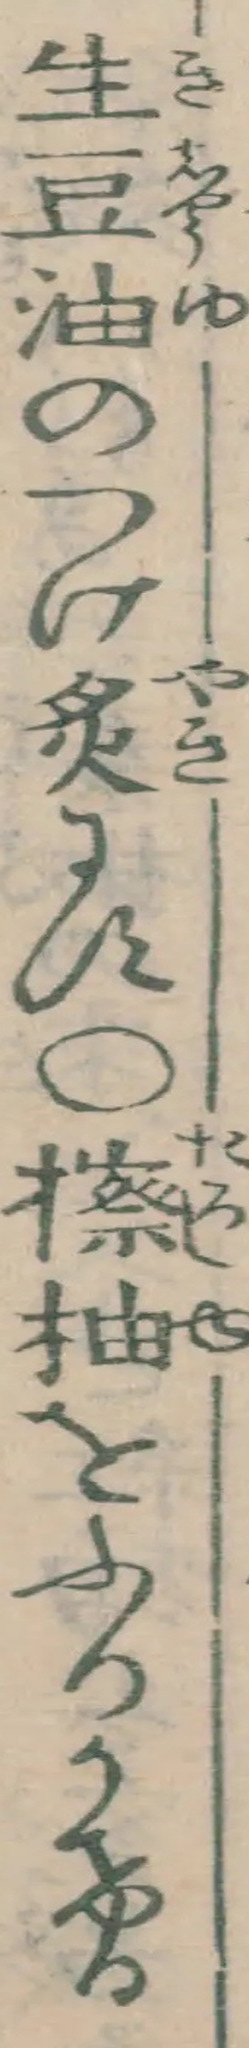生豆油のつけ炙にす○擦柚をふりかける
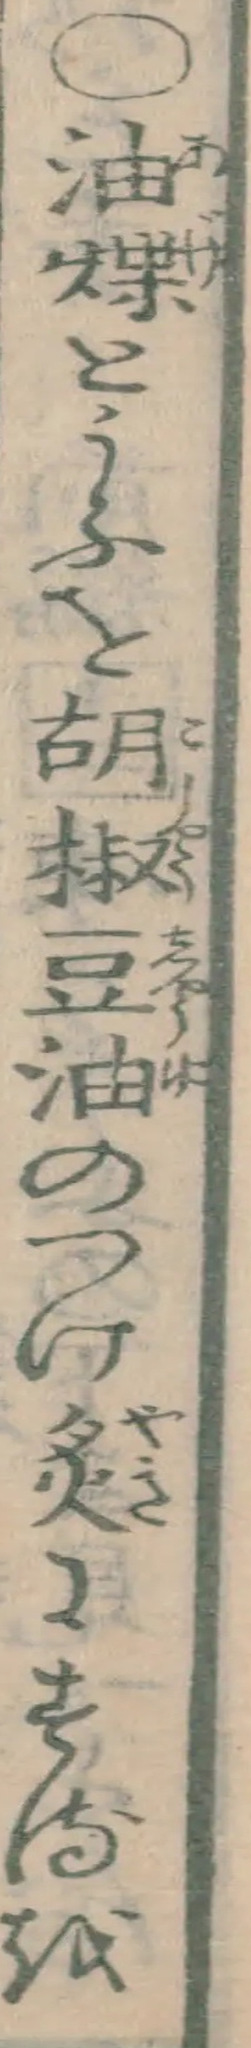○油煠とうふを胡椒豆油のつけ炙にするを
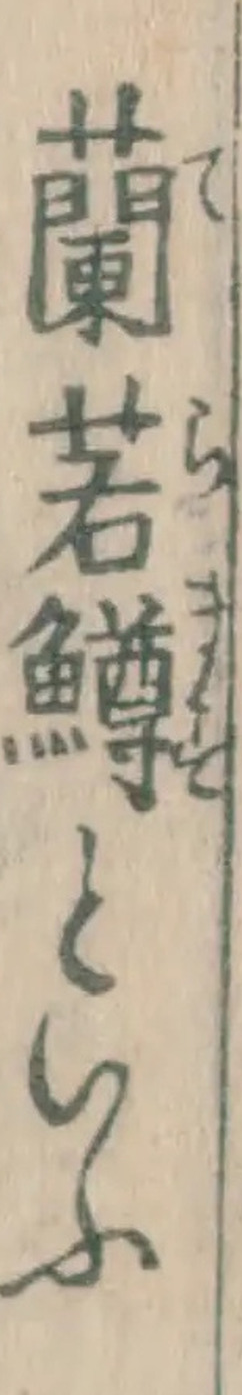蘭若鱒といふ
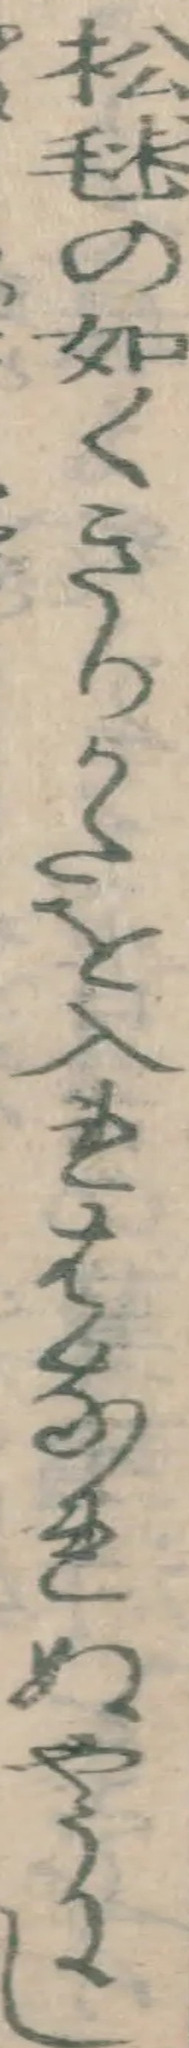松毬の如くきりかたを入れはなれぬやうにし
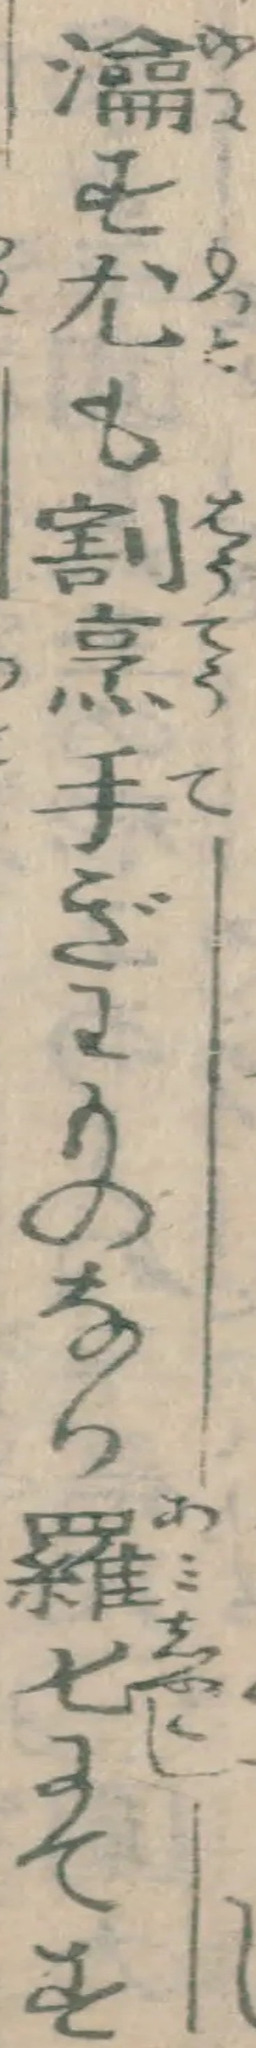瀹す尤も割烹手ぎわものなり羅匕にてす
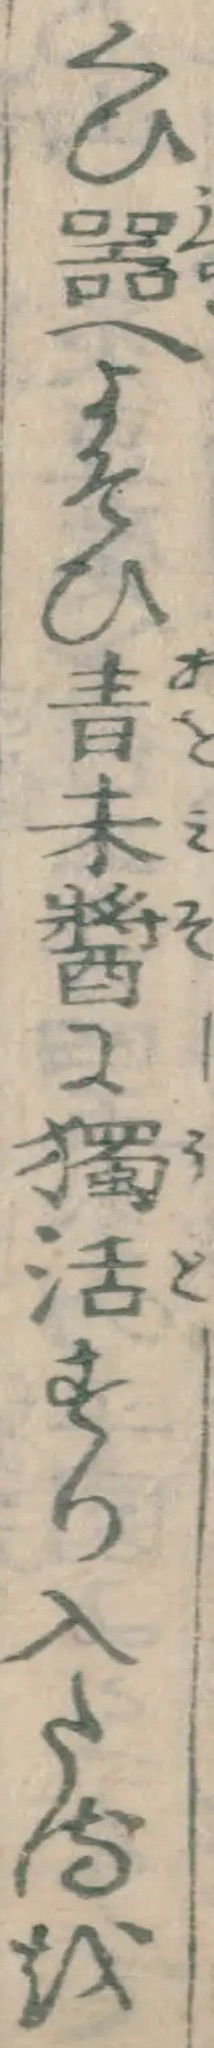くひ器へよそひ青未醤に独活すり入たるを
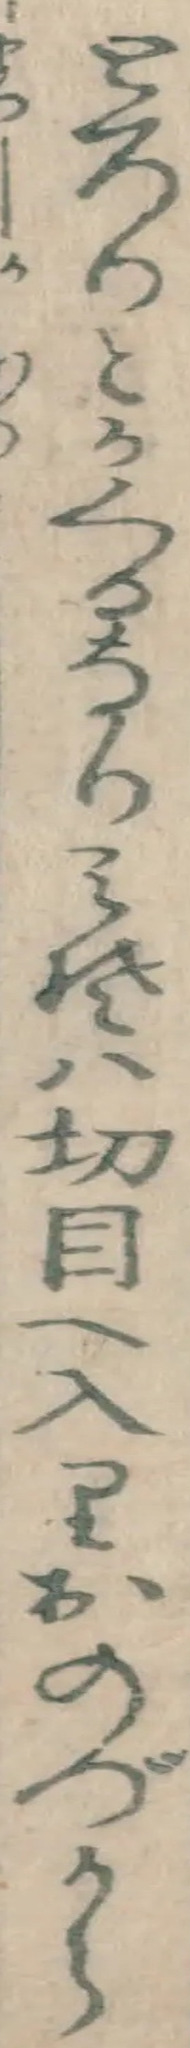とろりとかくるなりみそは切目へ入りおのづから
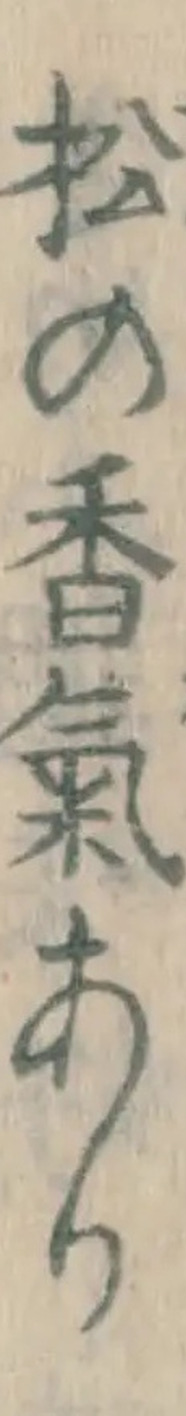松の香気あり
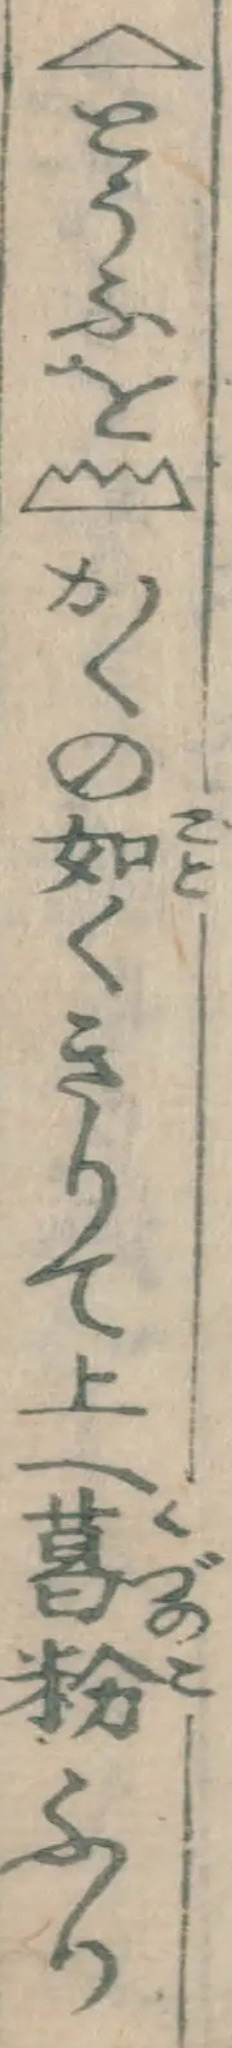△とうふをかくの如くきりて上へ葛粉ふり

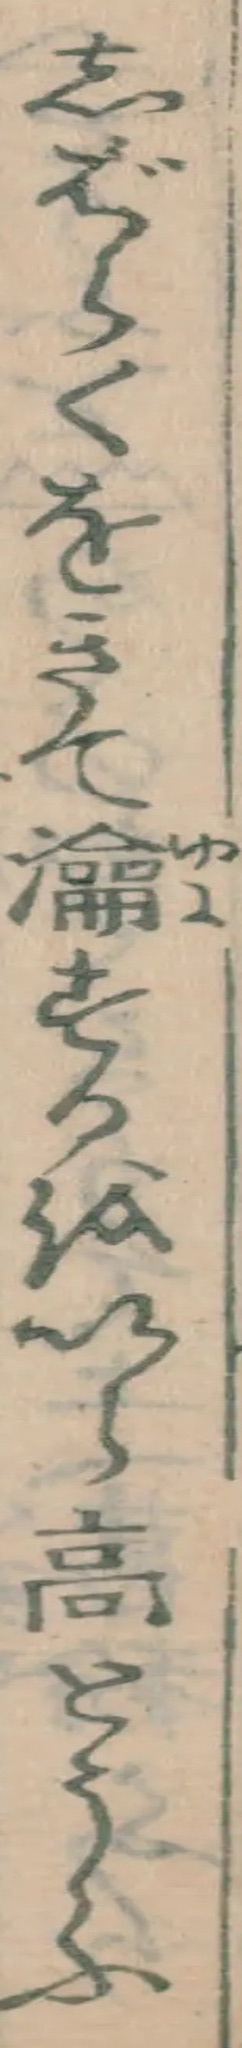しばらくをきて瀹するをいら高とうふ
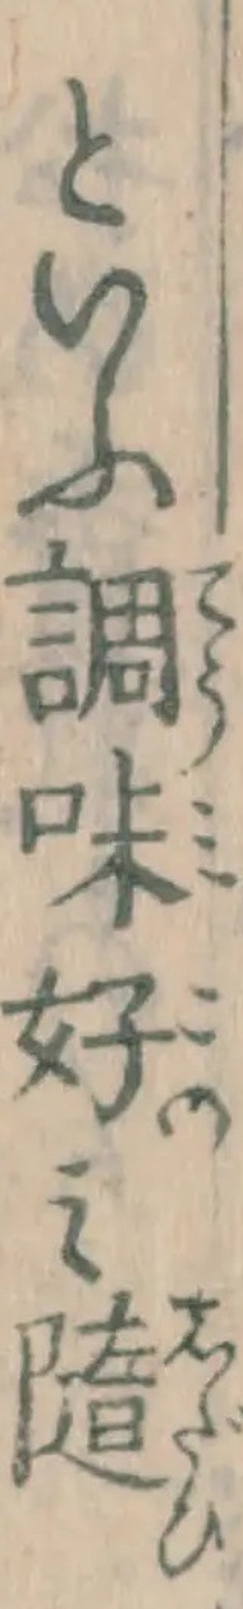といふ調味好み随
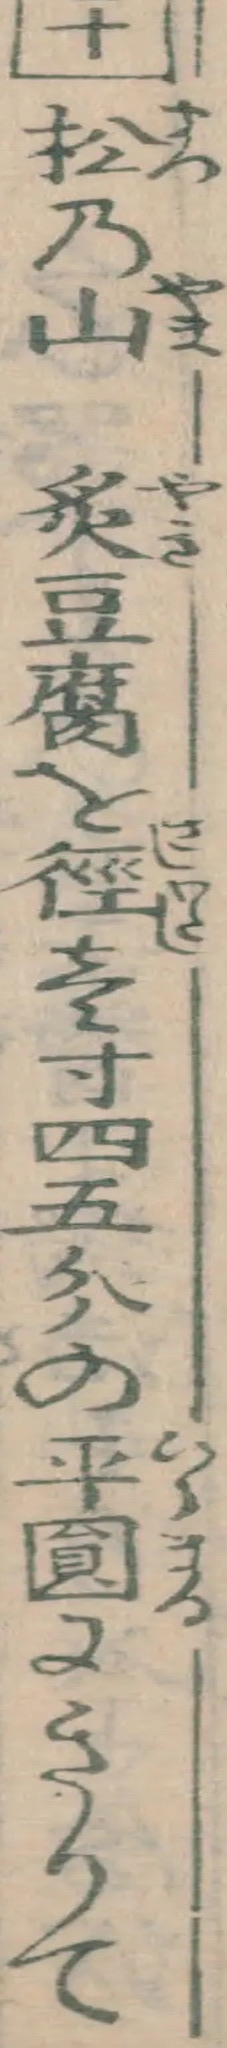七十松の山炙豆腐を径壱寸四五分の平円にきりて
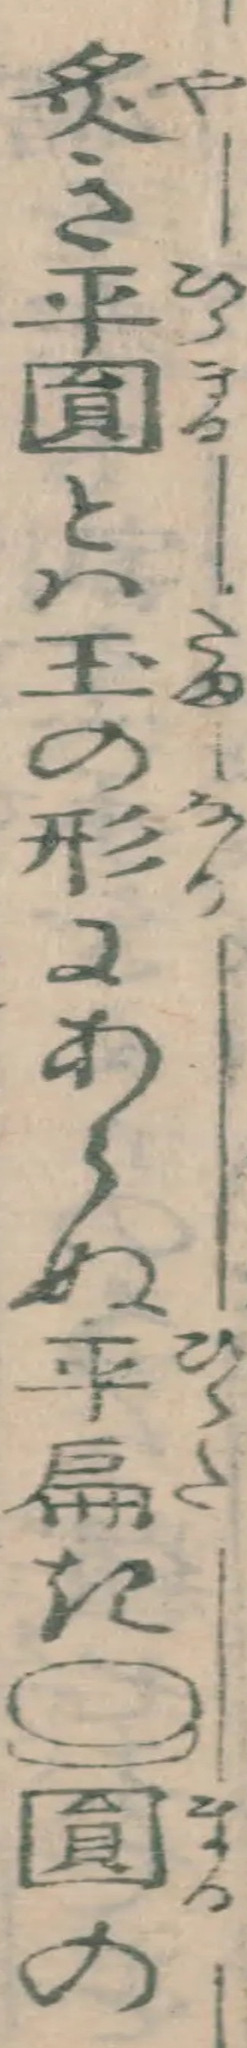炙き平円とは玉の形にあらぬ平扁き円の
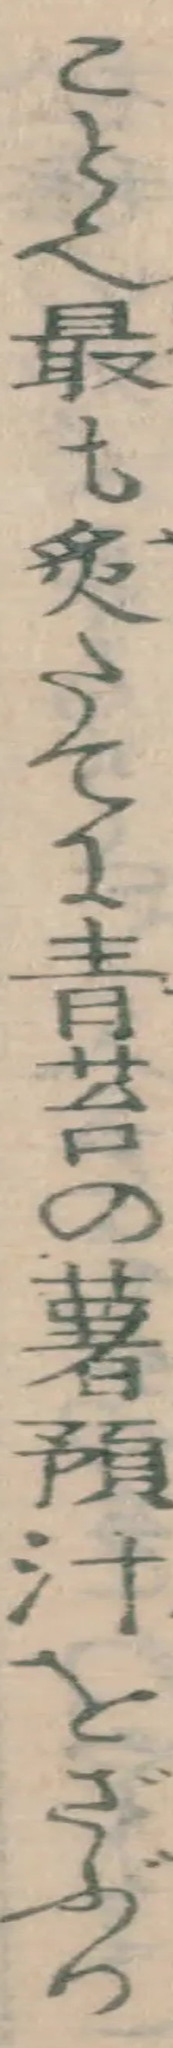こと也最も炙たてに青苔の薯預汁をざぶり
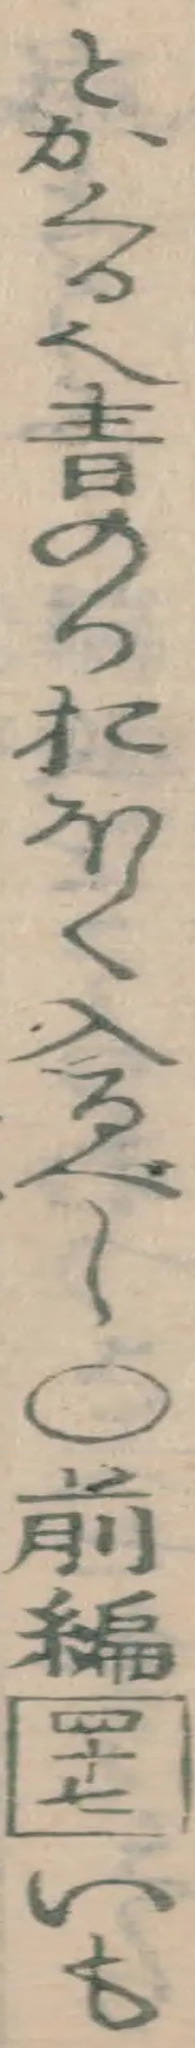とかくる也青のりおほく入るべし○前編四十七いも
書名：豆腐百珍. 続編
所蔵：国立国会図書館 National Diet Library, JAPAN
